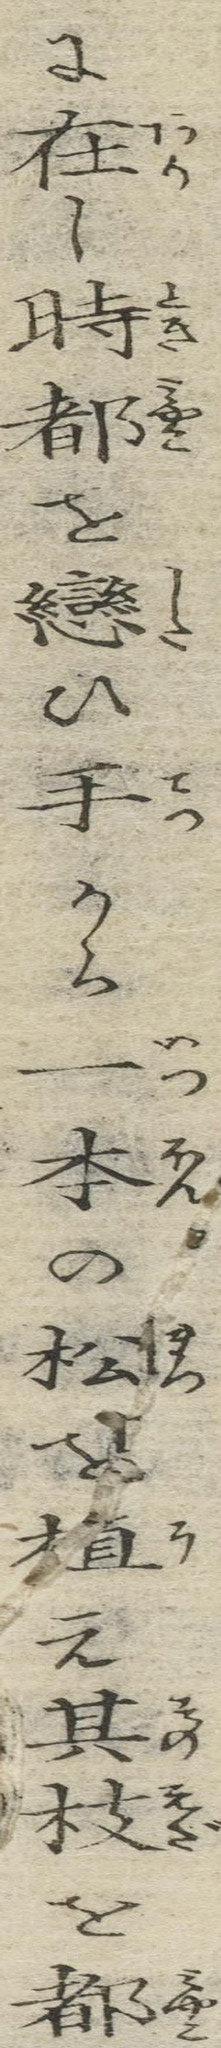に在し時都を恋ひ手から一本の松を植え其枝を都
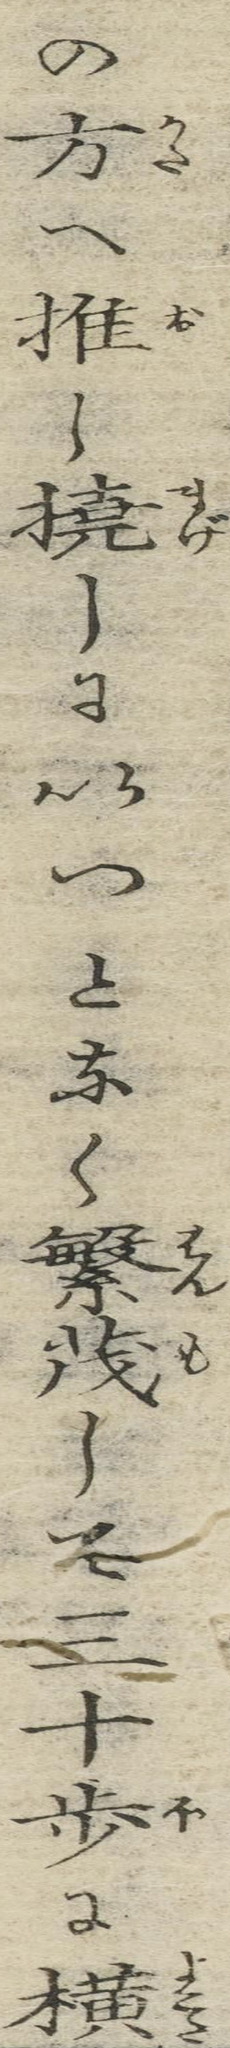の方へ推し橈しにいつとなく繁茂して三十歩に横
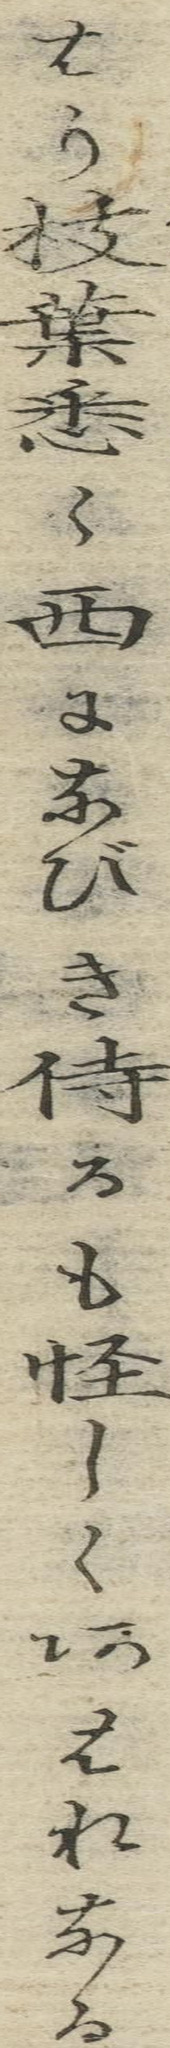はり枝葉悉く西になびき侍るも怪しくあはれなる

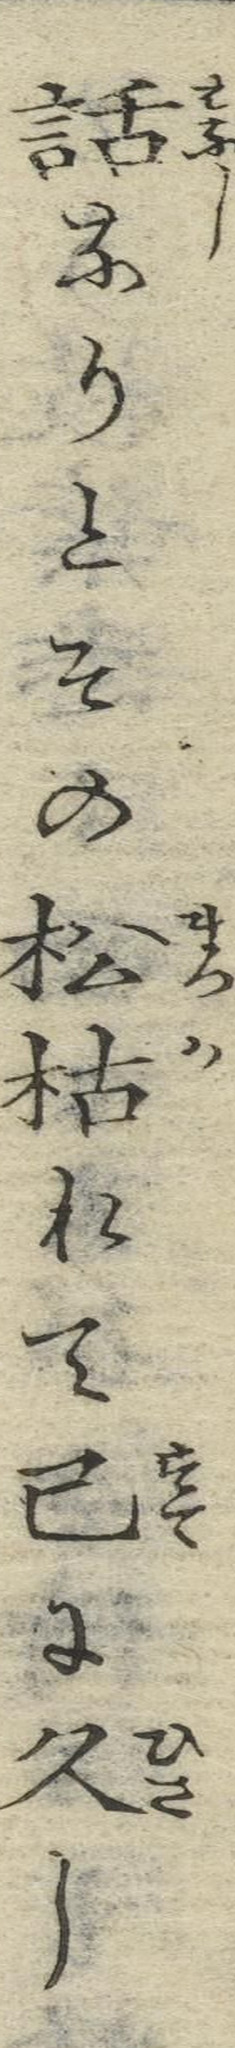話なりとその松枯れて已に久し
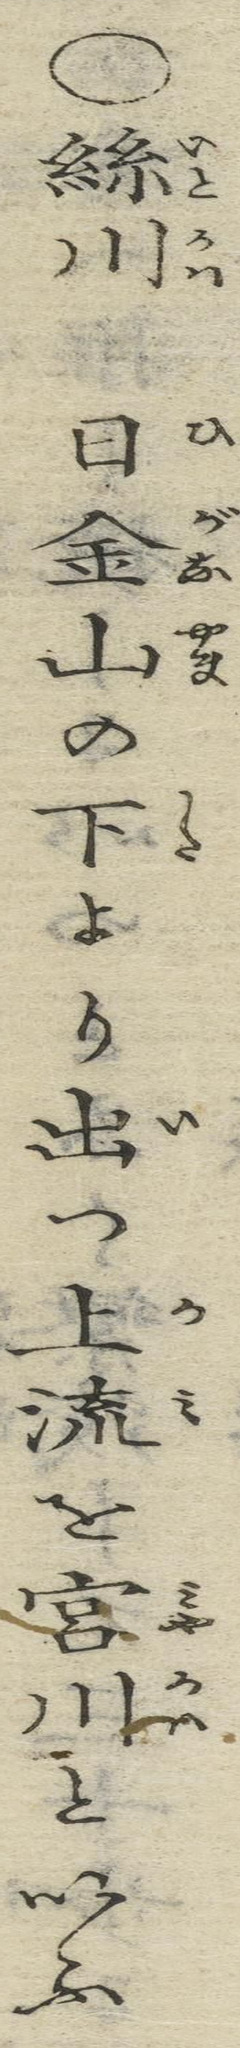○絲川日金山の下より出つ上流を宮川といふ
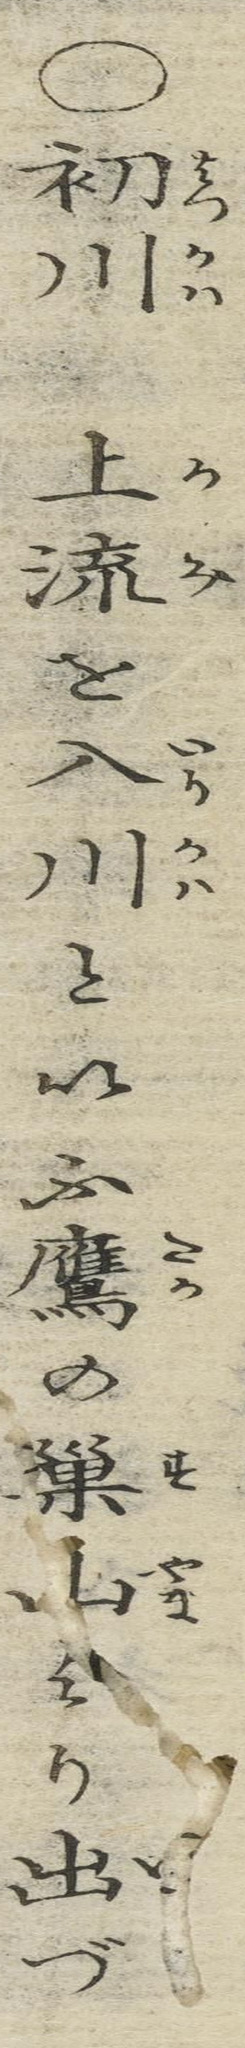○初川上流を入川といふ鷹の巣山より出づ
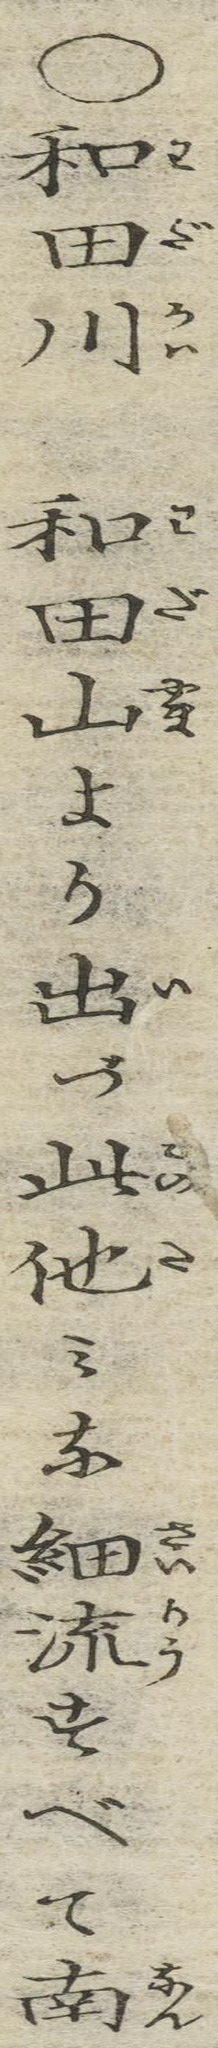○和田川和田山より出づ此他みな細流すべて南
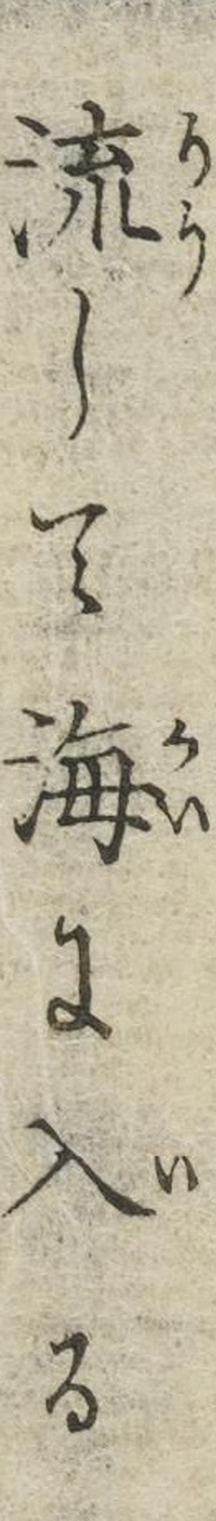流して海に入る
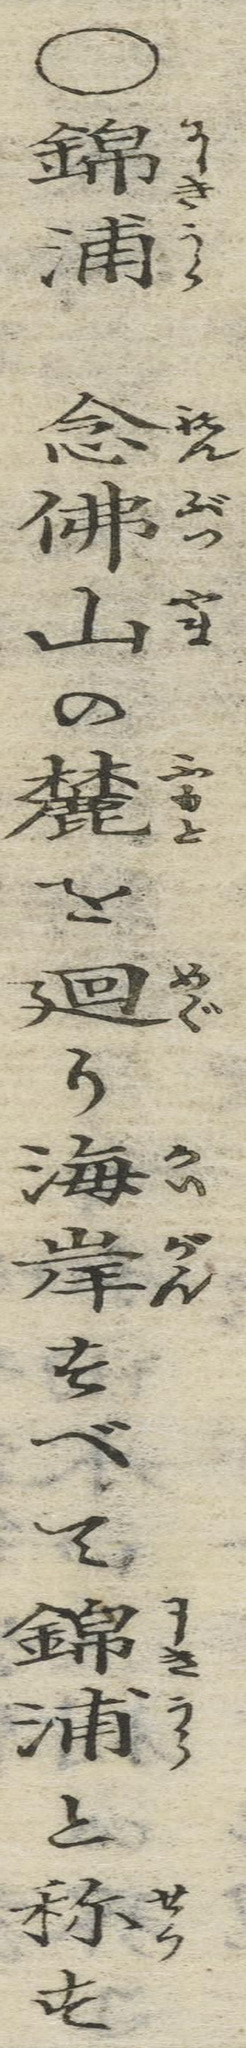○錦浦念仏山の麓を迴り海岸すべて錦浦と称す
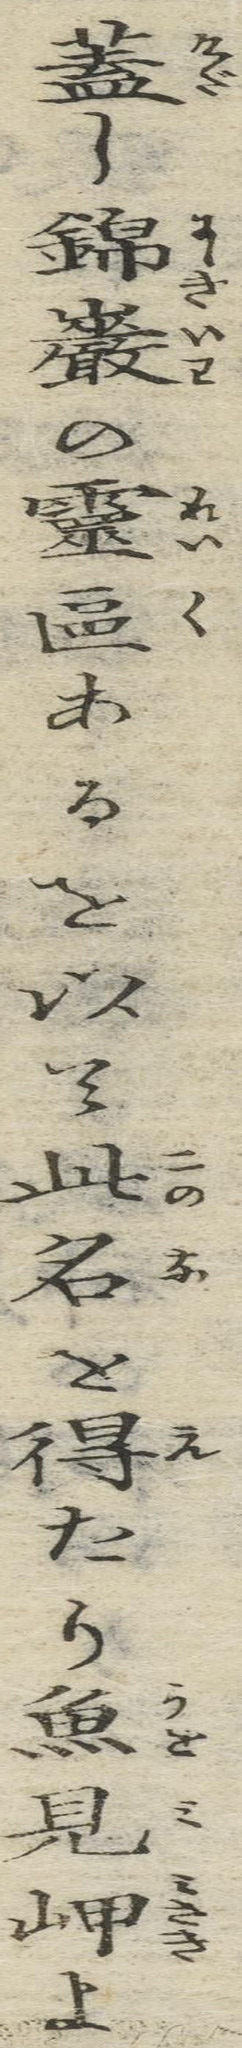蓋し錦巌の霊区あるを以て此名を得たり魚見岬よ
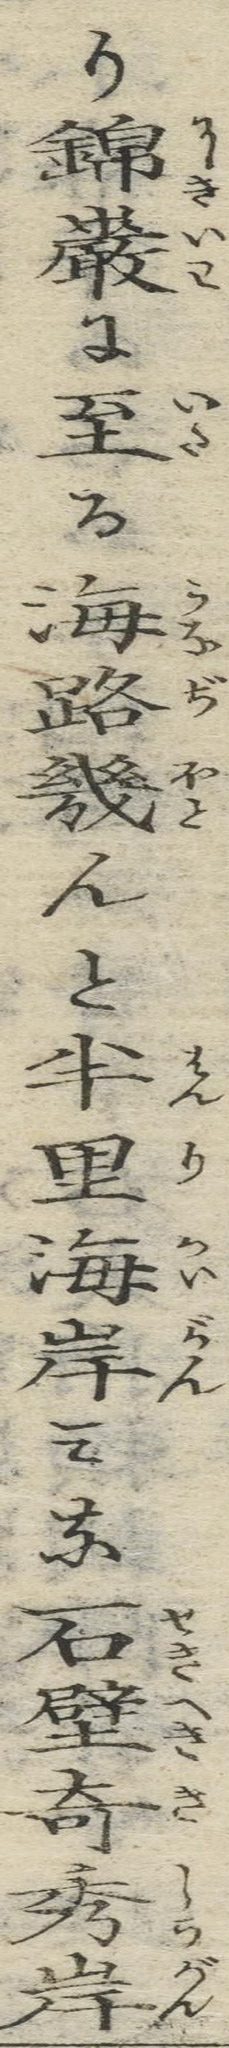り錦巌に至る海路幾んと半里海岸みな石壁奇秀岸
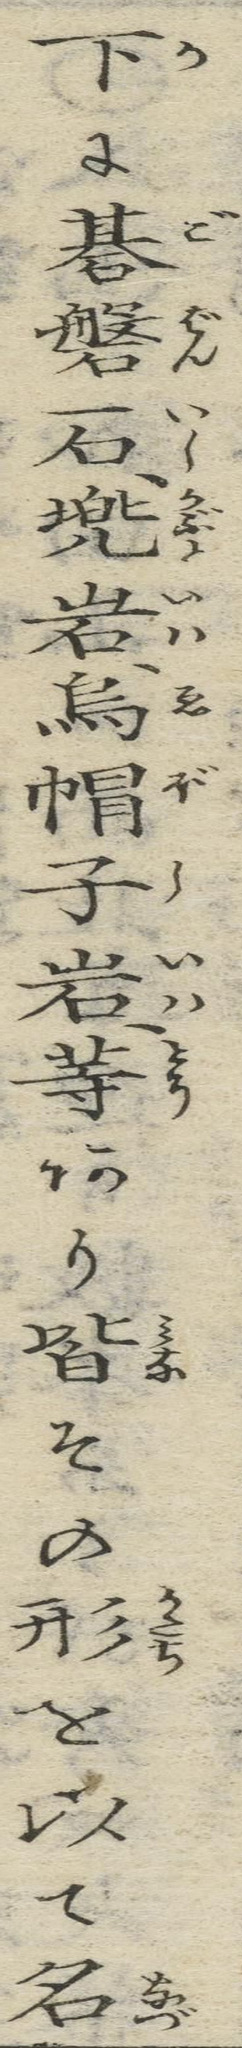下に碁盤石、兜岩、烏帽子岩、等あり皆その形を以て名
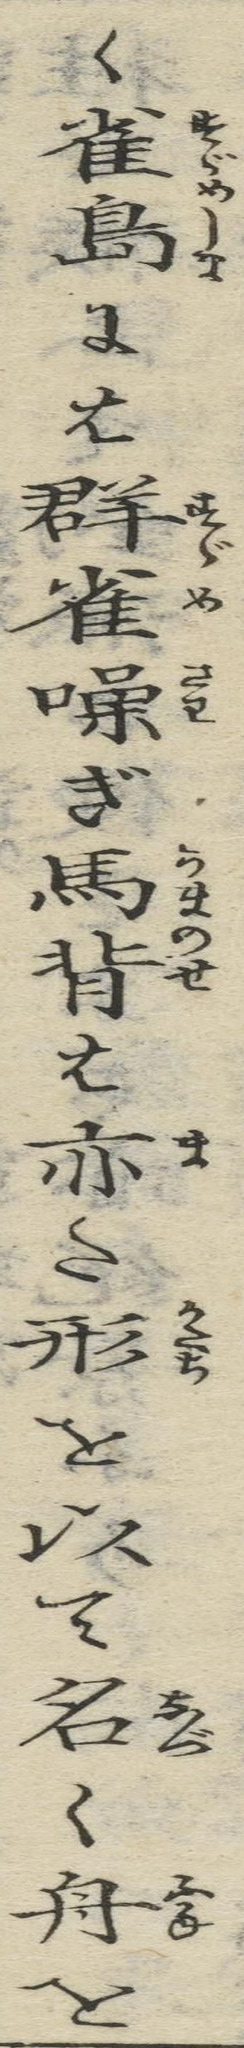く、雀島には群雀噪ぎ馬背は亦た形を以て名く舟を
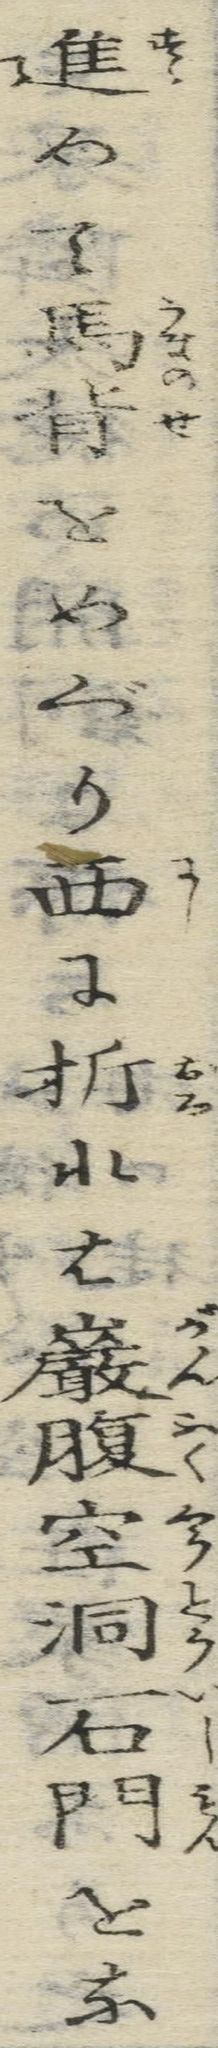進めて馬背をめぐり西に折れは巌腹空洞石門をな
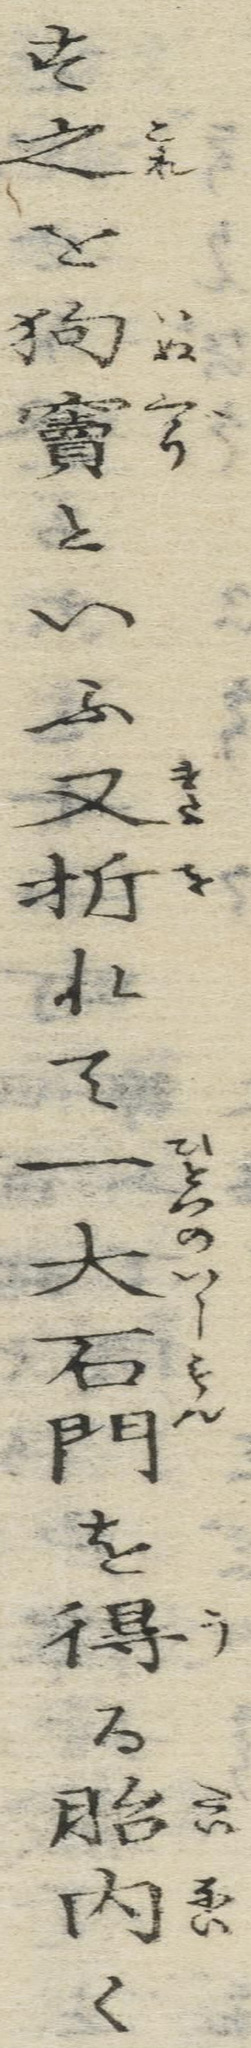す之を狗竇といふ又折れて一大石門を得る胎内く
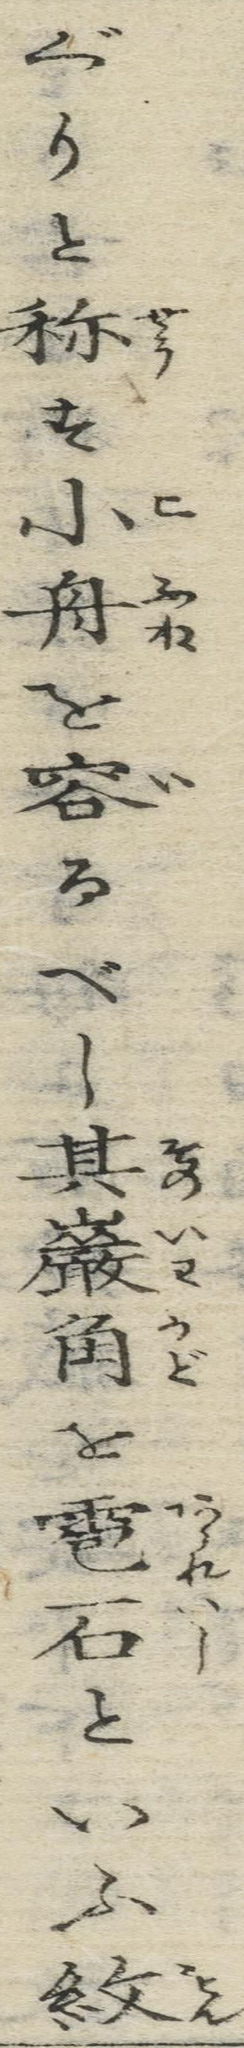ぐりと称す小舟を容るべし其巌角を雹石といふ紋
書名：豆州熱海誌　完
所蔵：東京大学地震研究所図書室 Earthquake Research Institute Library, The University of Tokyo, JAPAN
